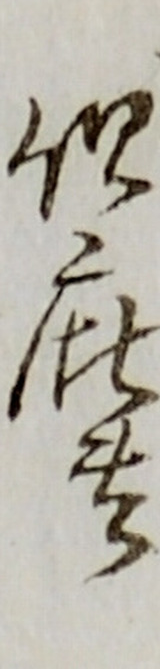但庇共
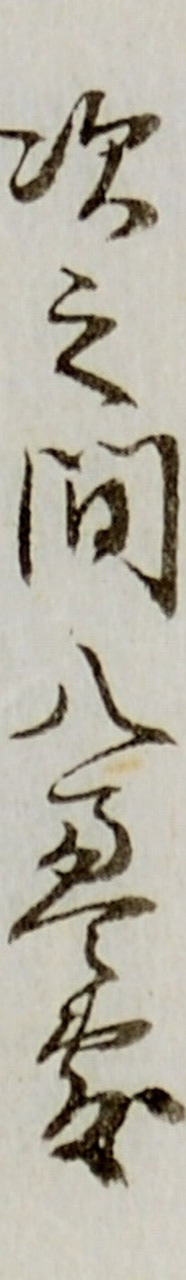次之間八畳敷
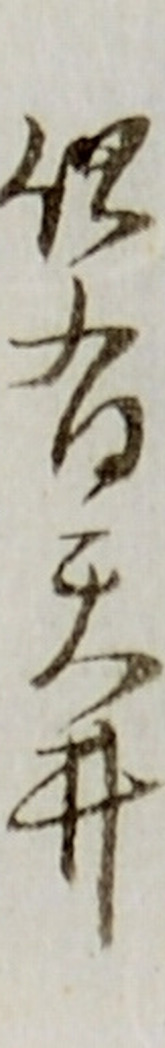但有天井
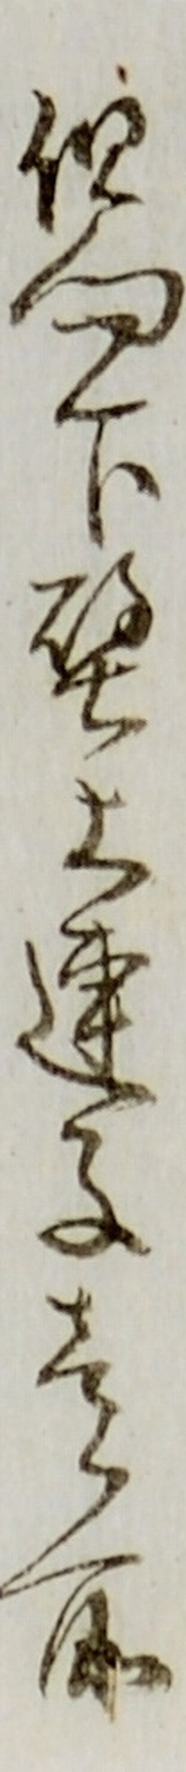但向下壁上連子壱ヶ所
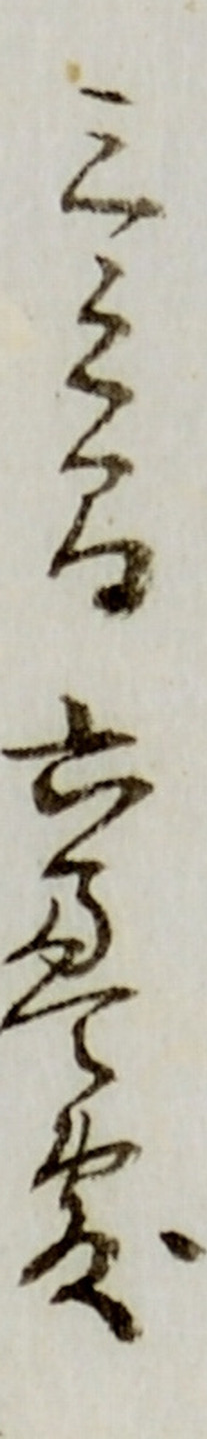三之間六畳敷
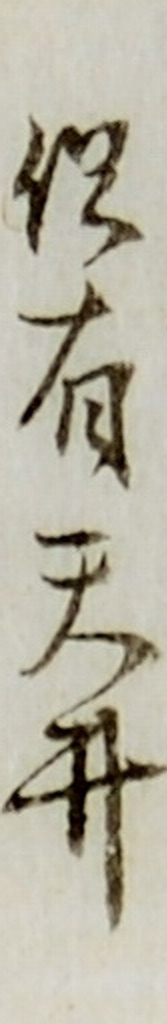但有天井
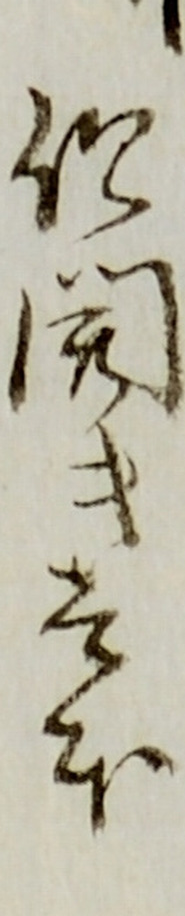但開キ壱本
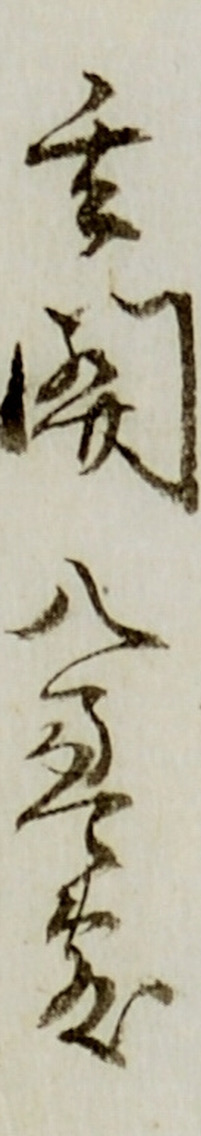玄関八畳敷
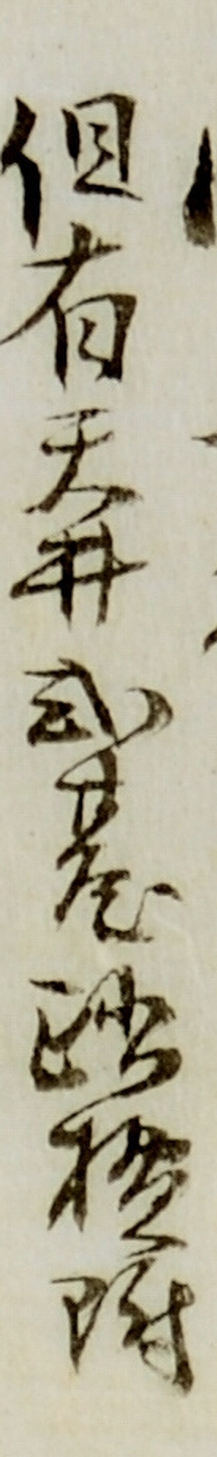但有天井式台踏檀附
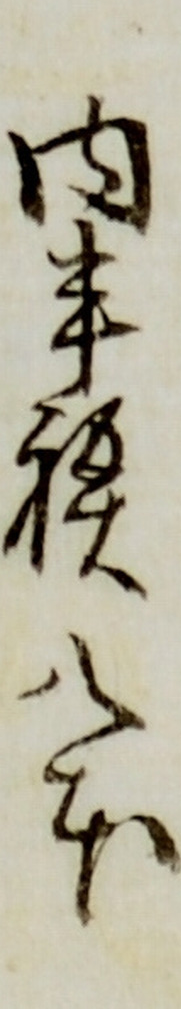内半襖八本
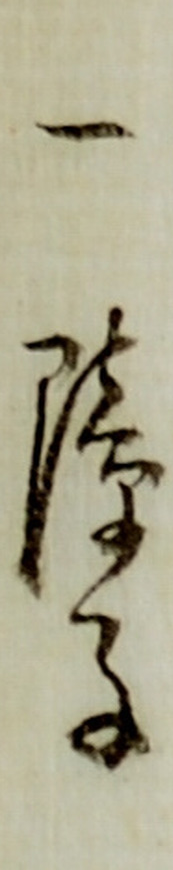一障子
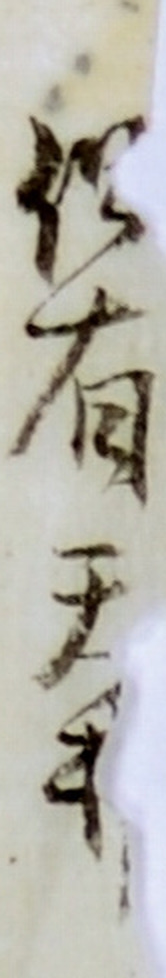但有天井
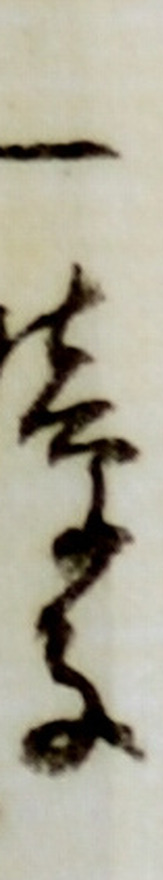一障子

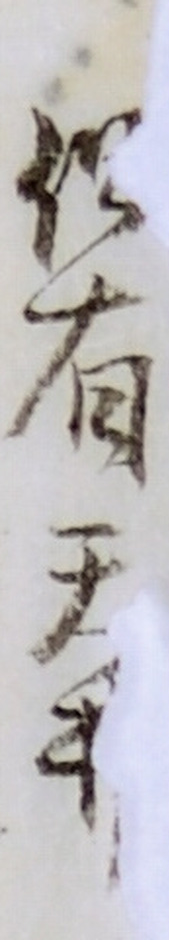但有天井
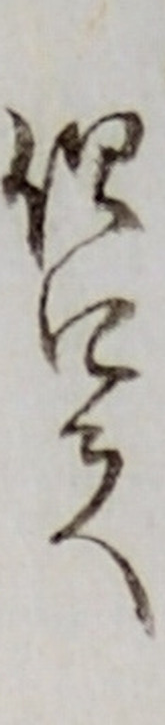但四尺
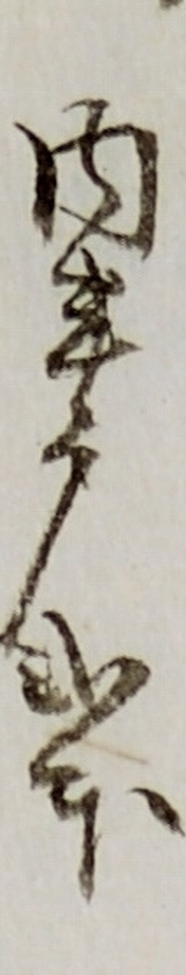内半戸弐本
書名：山林方諸事御用留
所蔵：伊那市立高遠町図書館・合同会社AMANE
